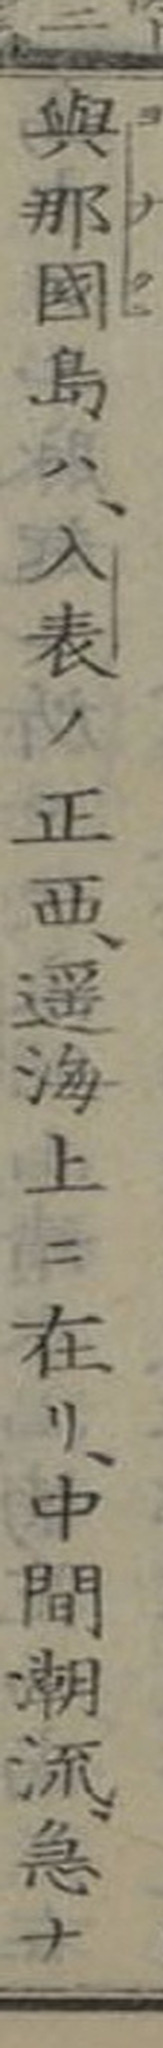与那国島ハ、入表ノ正西、遥海上ニ在リ、中間潮流、急ナ
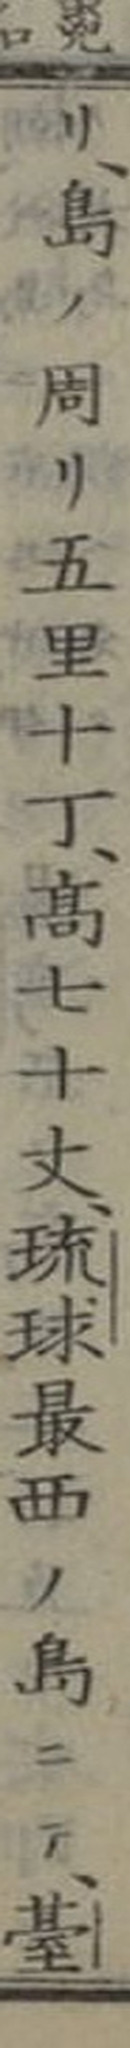リ、島ノ周リ五里十丁、高七十丈、琉球最西ノ島ニテ、台
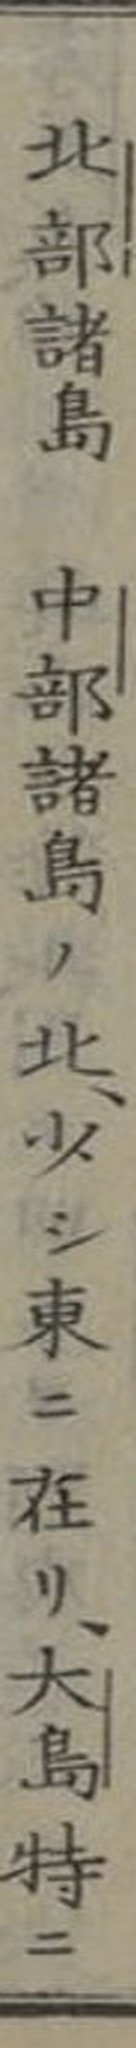北部諸島中部諸島ノ北、少シ東ニ在リ、大島特ニ
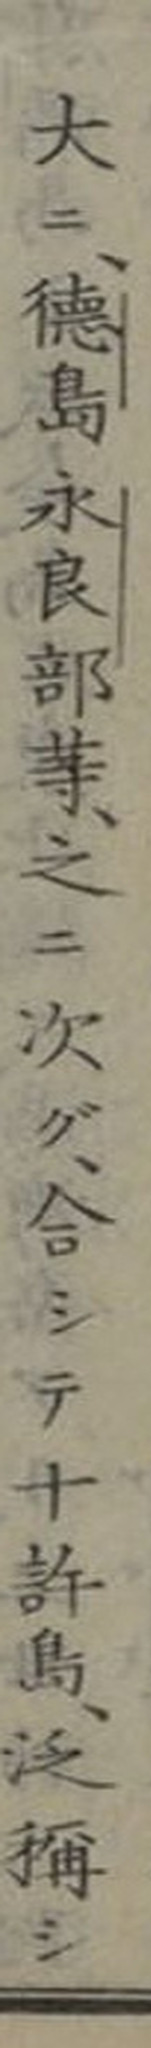大ニ、徳島永良部等、之ニ次グ、合シテ十許島、泛称シ
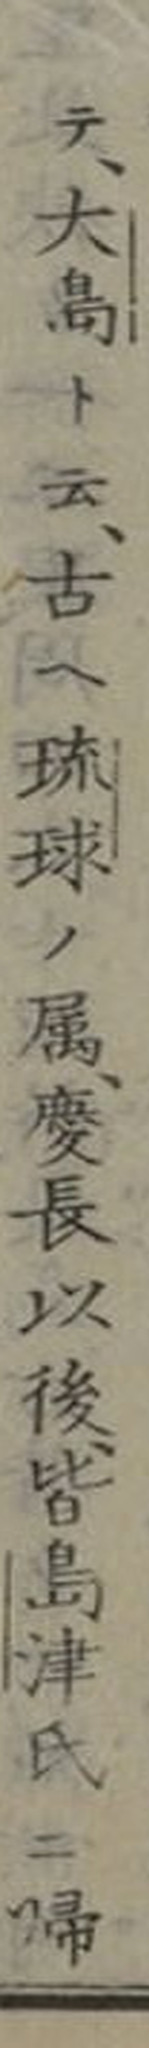テ、大島ト云、古ヘ琉球ノ属、慶長以後、皆島津氏ニ帰
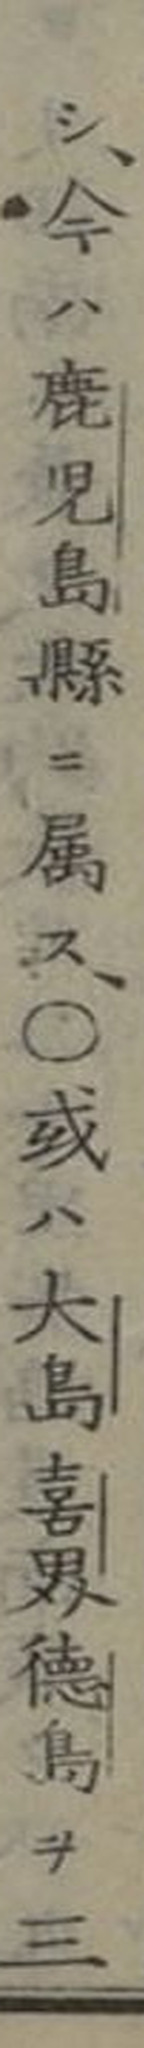シ、今ハ鹿児島県ニ属ス、○或ハ大島喜界徳島ヲ三
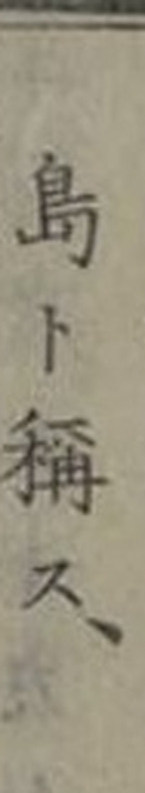島ト称ス、
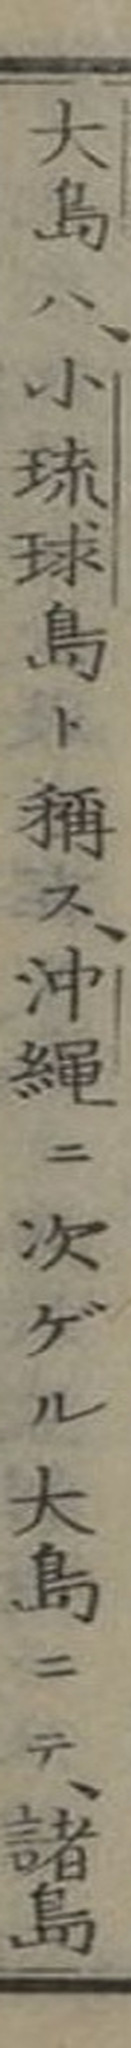大島ハ、小琉球島ト称ス、沖縄ニ次ゲル大島ニテ、諸島

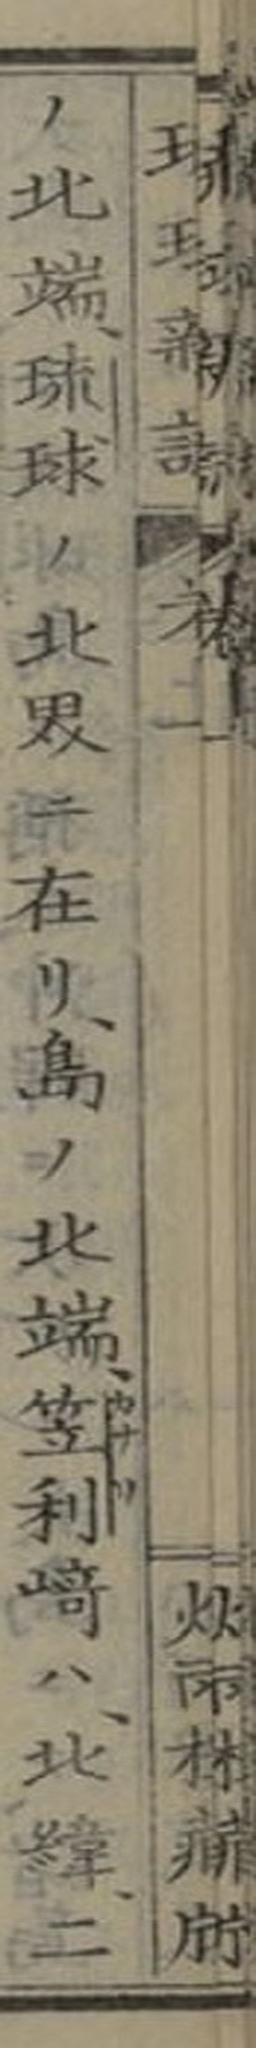ノ北端、琉球ノ北界ニ在リ、島ノ北端、笠利崎ハ、北緯二
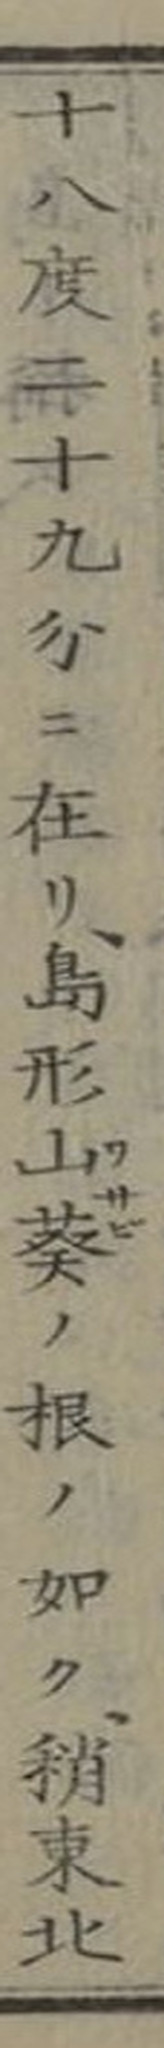十八度二十九分ニ在リ、島形山葵ノ根ノ如ク、稍東北
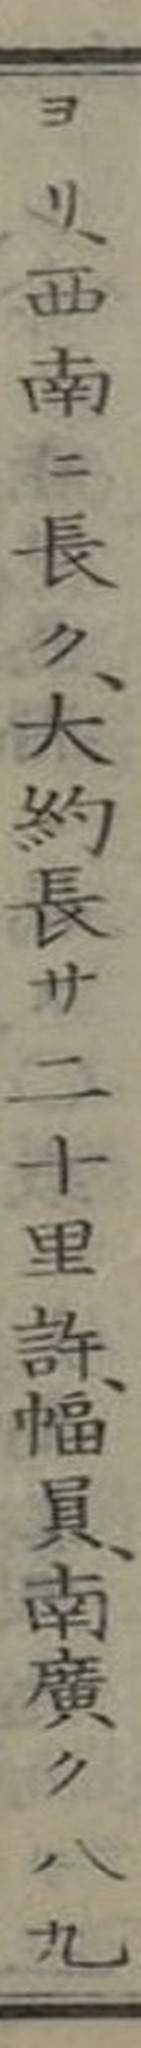ヨリ、西南ニ長ク、大約長サ二十里許、幅員、南広ク八九
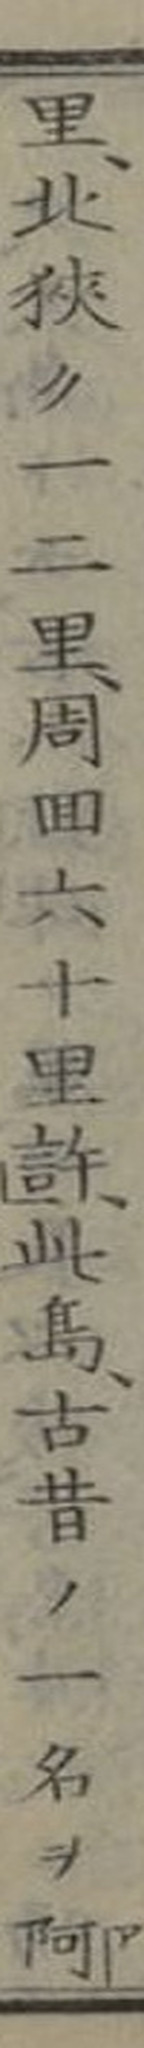里、北狭ク一二里、周回六十里許、」此島、古昔ノ一名ヲ阿
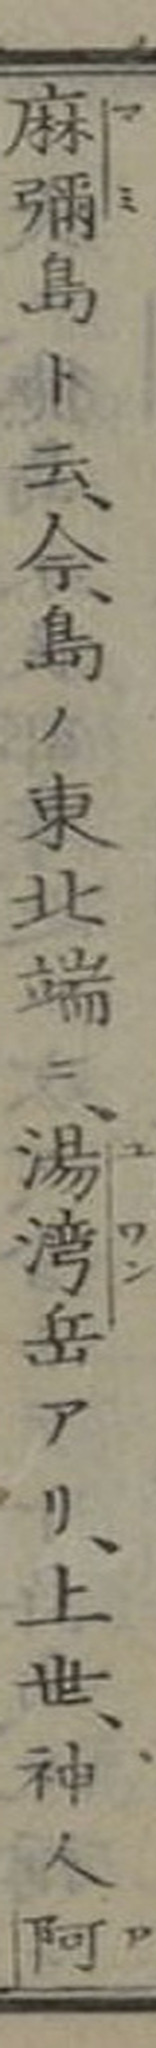麻弥島ト云、今、島ノ東北端ニ、湯湾岳アリ、上世、神人阿
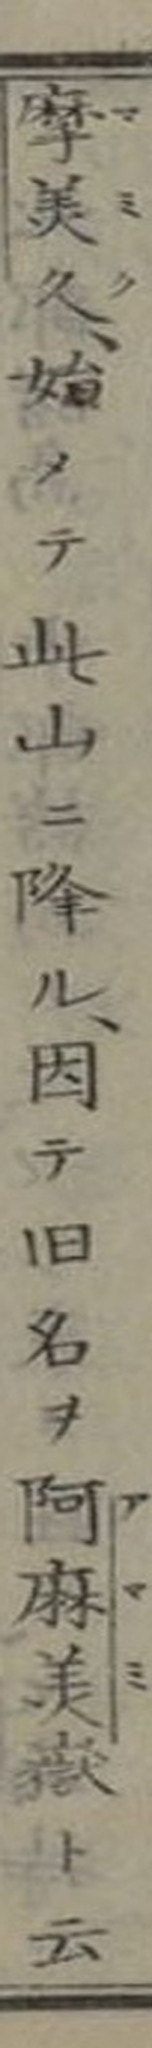摩美久、始メテ此山ニ降ル、因テ旧名ヲ阿麻美岳ト云
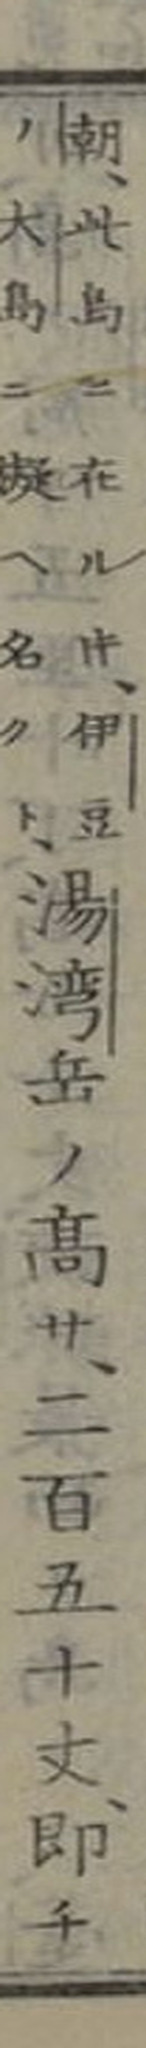朝、此島ニ在ルトキ、伊豆ノ大島ニ擬ヘ名クト、湯湾岳ノ高サ、二百五十丈、即チ
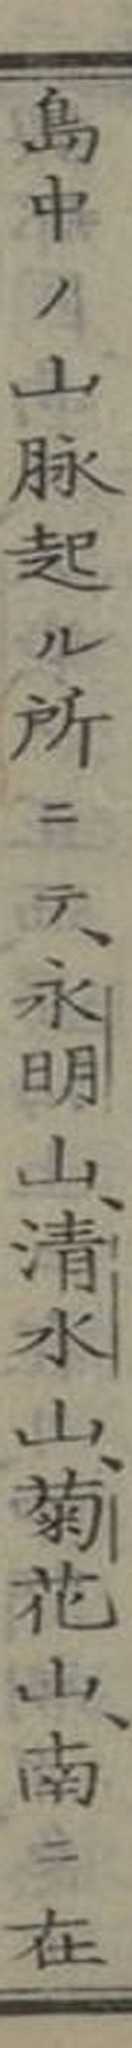島中ノ山脈起ル所ニテ、永明山、清水山、菊花山、南ニ在
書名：琉球新誌 図附 上
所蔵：University of the Ryukyus Library
